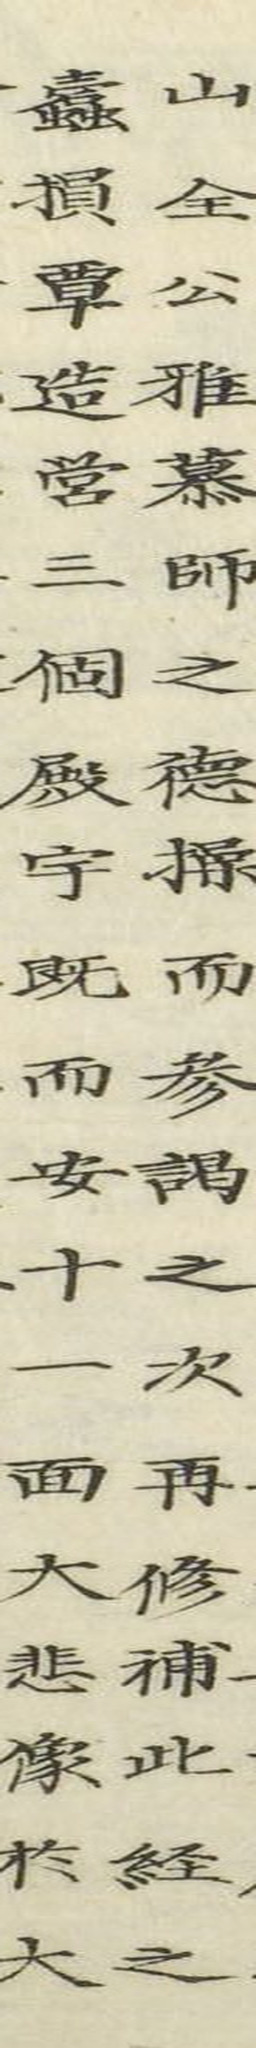蠧損覃造営三個殿宇既而安十一面大悲像於大
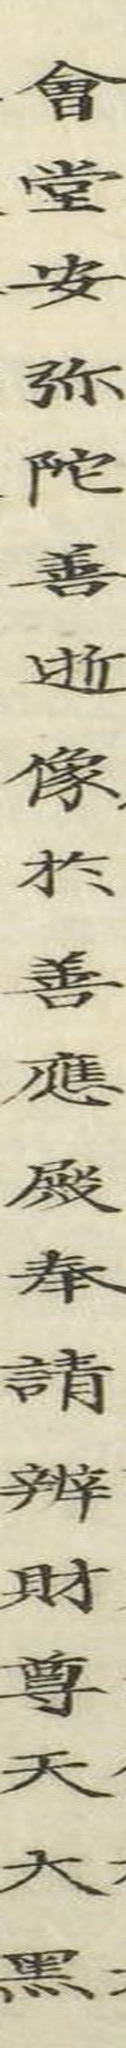会堂安弥陀善逝像於善応殿奉請弁財尊天大黒
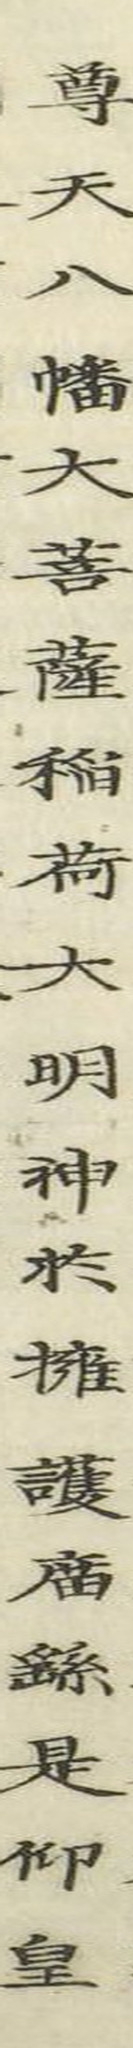尊天八幡大菩薩稲荷大明神於擁護庿繇是仰皇
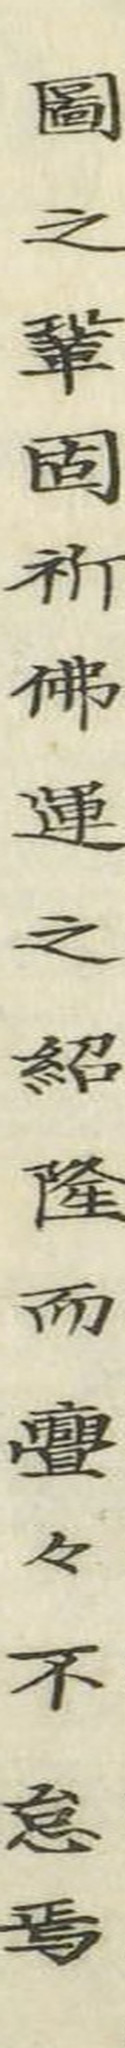図之鞏固祈仏運之紹隆而亹々不怠焉
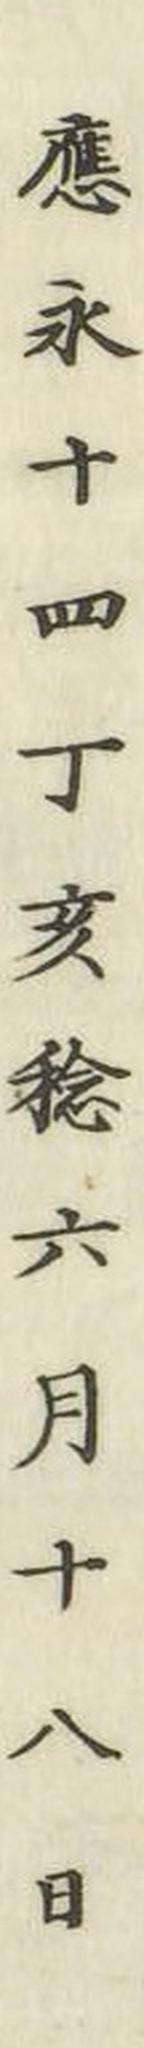応永十四丁亥稔六月十八日
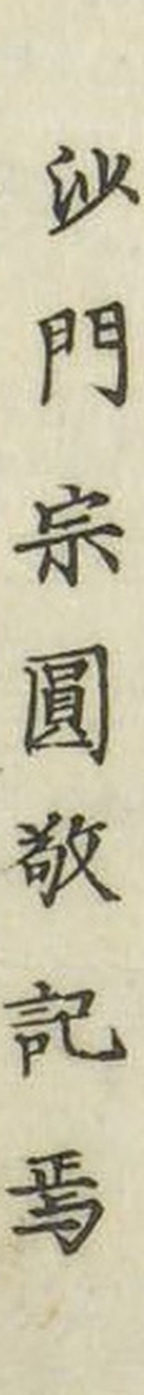沙門宗圓敬記焉
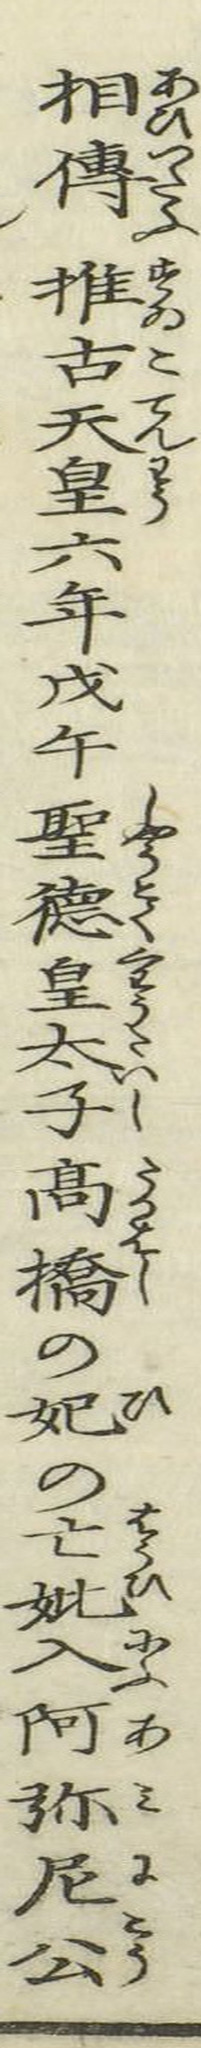相伝推古天皇六年戊午聖徳皇太子高橋の妃の亡妣入阿弥尼公
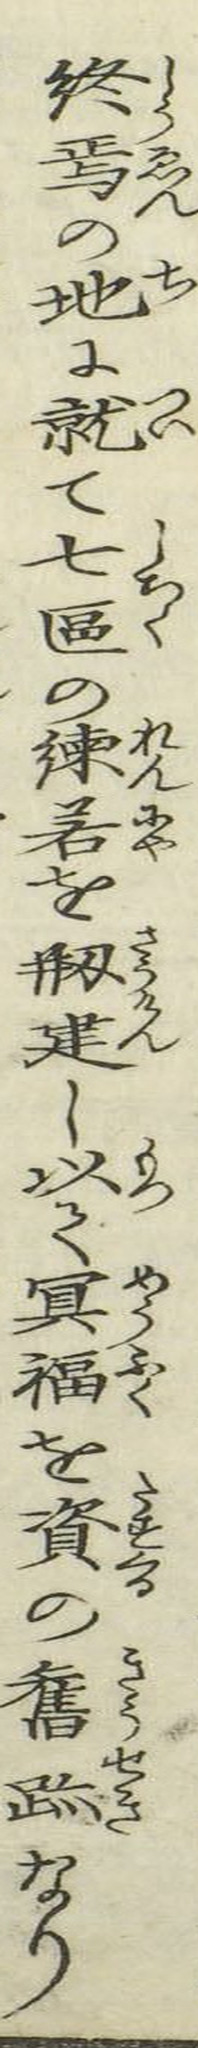終焉の地に就て七区の練若を剏建し以て冥福を資の奮跡なり
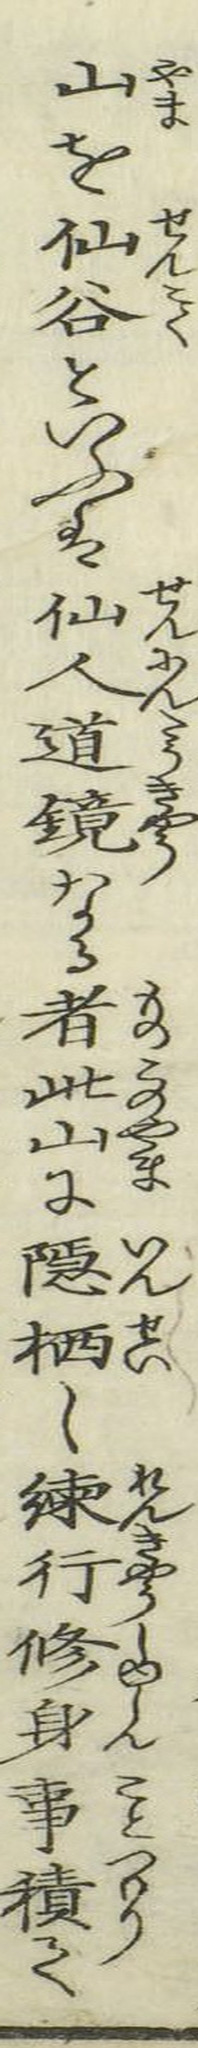山を仙谷といふは仙人道鏡なる者此山に隠栖し練行修身事積て
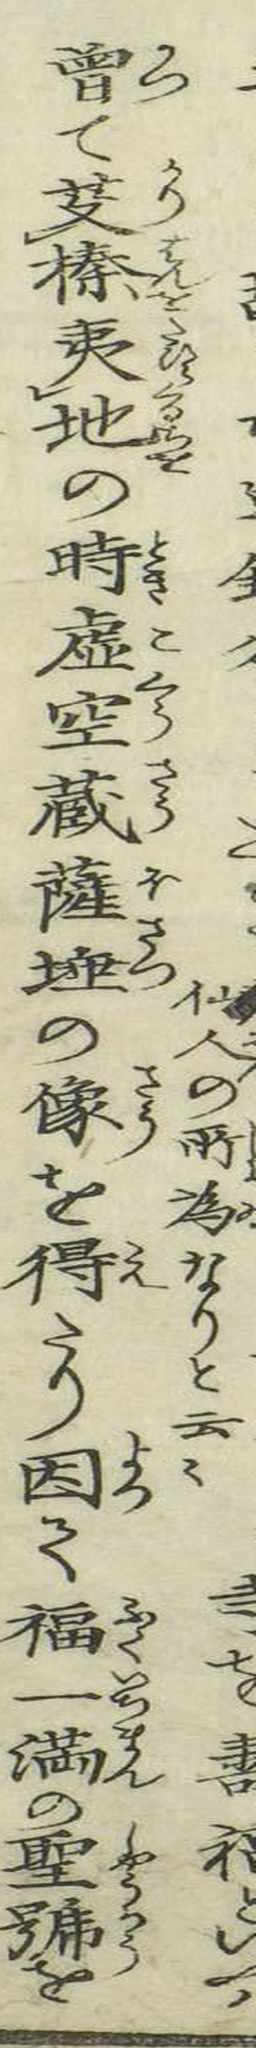曾て芟榛夷地の時虚空蔵薩埵の像を得たり因て福一満の聖号を

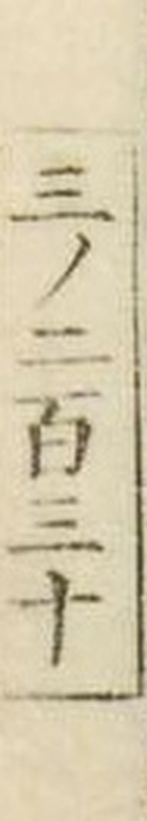三ノ二百三十

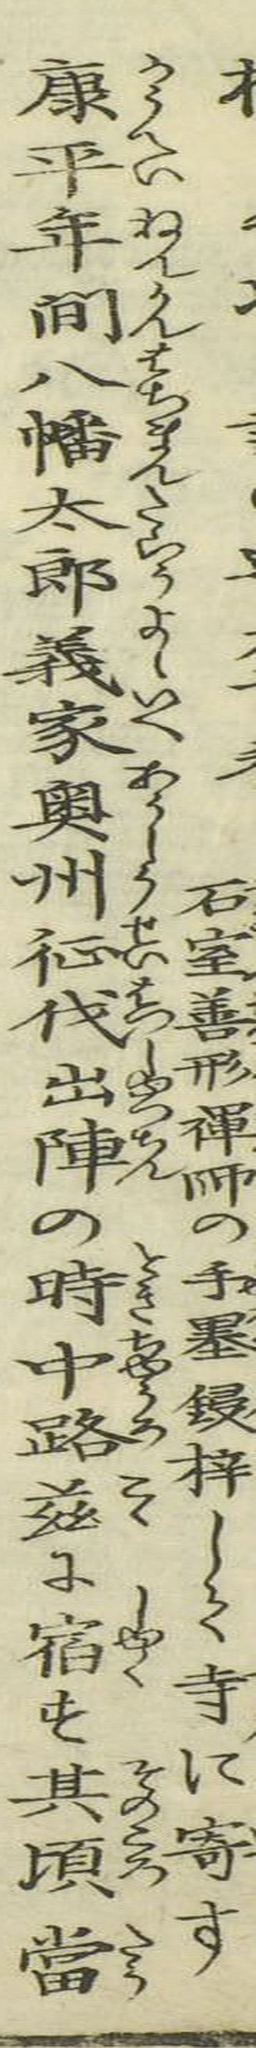康平年間八幡太郎義家奥州征伐出陣の時中路茲に宿す其頃当
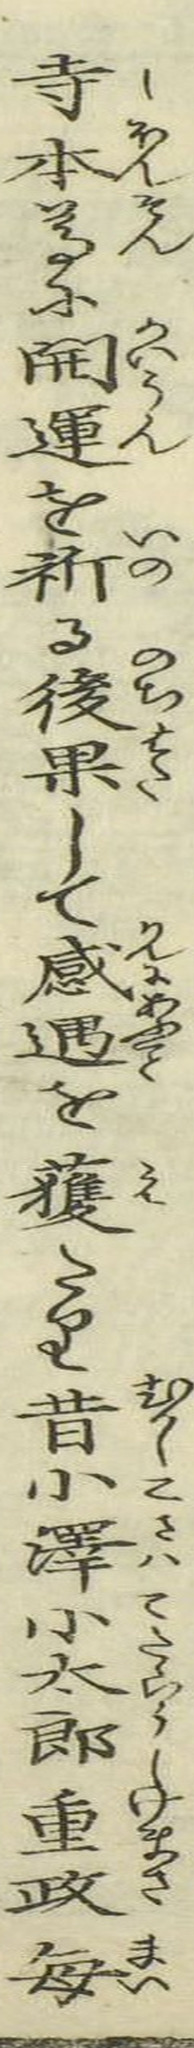寺本尊に開運を祈る後果して感遇を獲たり昔小沢小太郎重政毎
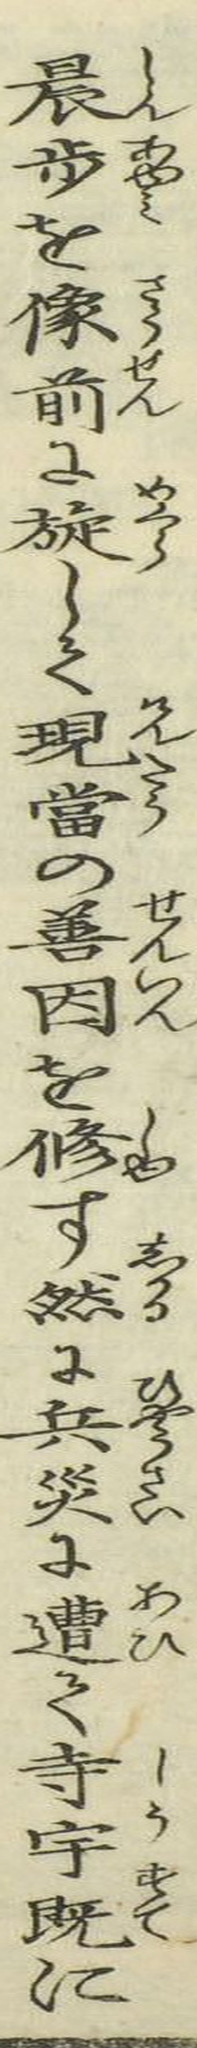晨歩を像前に旋して現当の善因を修す然に兵災に遭て寺宇既に
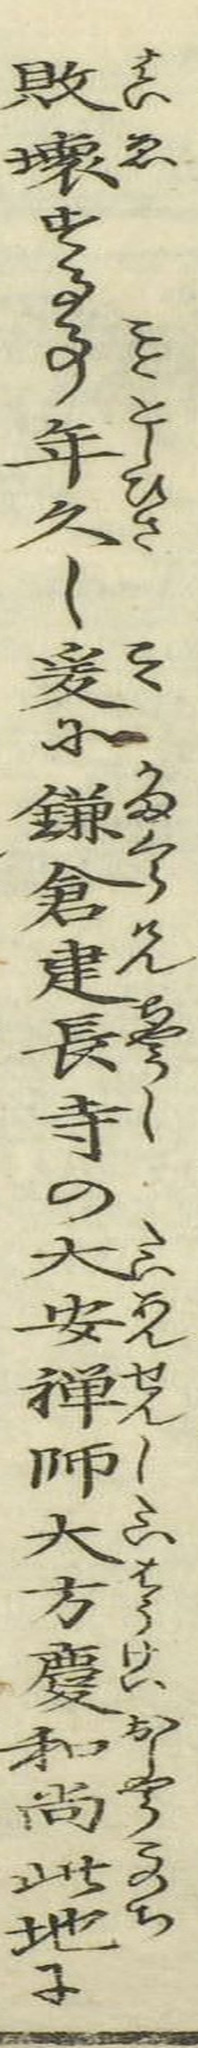敗壊する事年久し爰に鎌倉建長寺の大安禅師大方慶和尚此地に
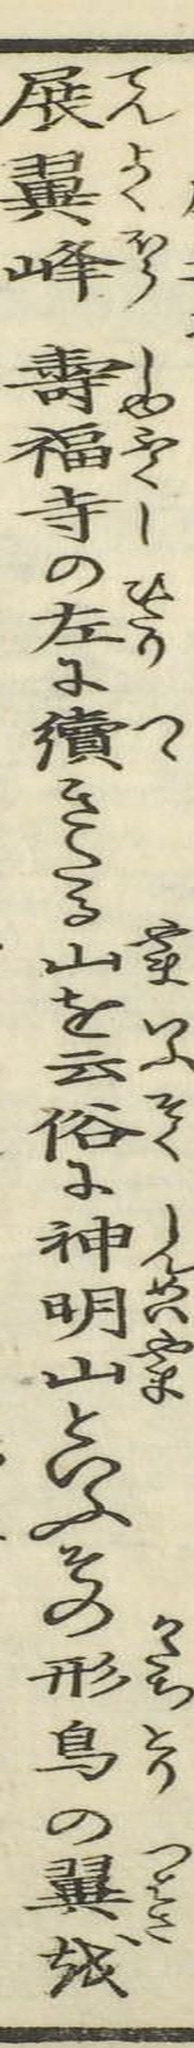展翼峰寿福寺の左に続きたる山を云俗に神明山といふその形鳥の翼を
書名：江戸名所図会 20巻 巻之10
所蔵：東京学芸大学教育コンテンツアーカイブ
